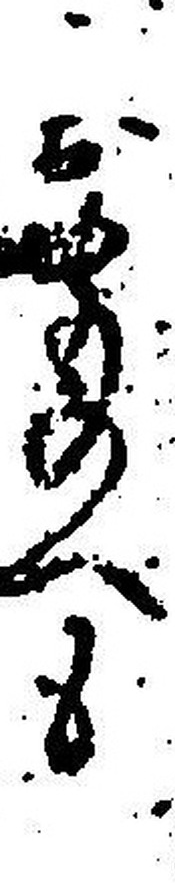おかものへも
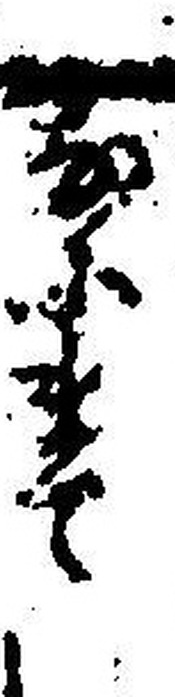なにまて
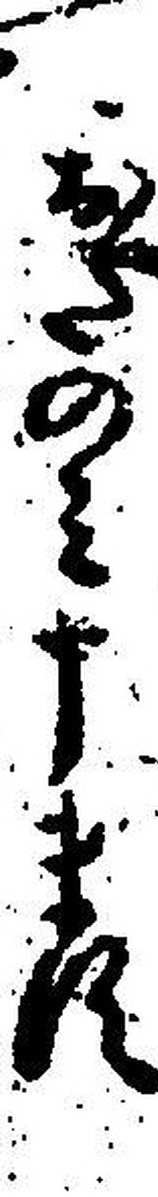たのみ申ます
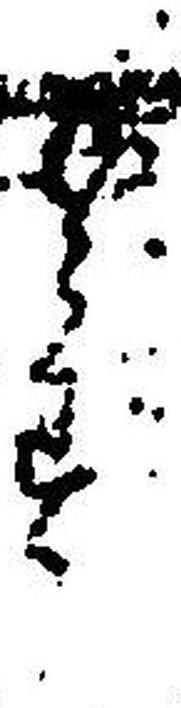やらす
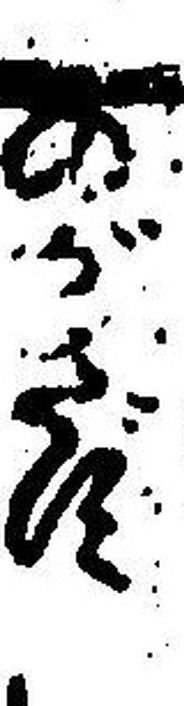のがさず
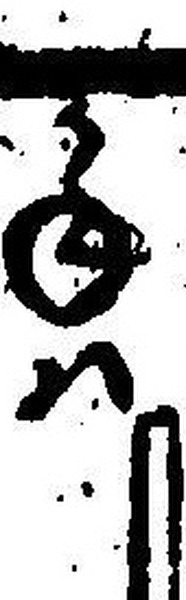かねは
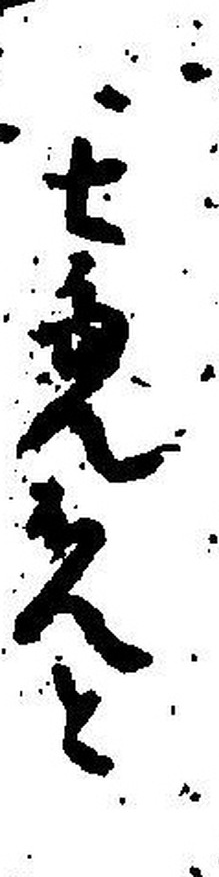七たんはんと
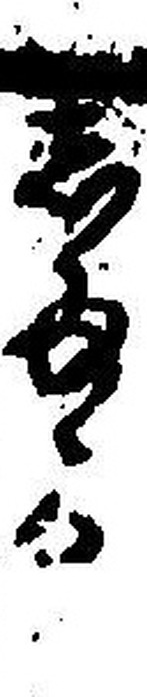したゝか
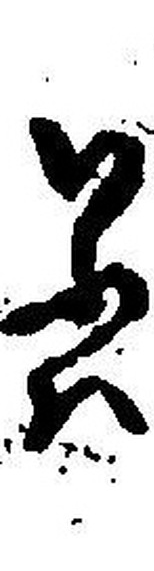いふは
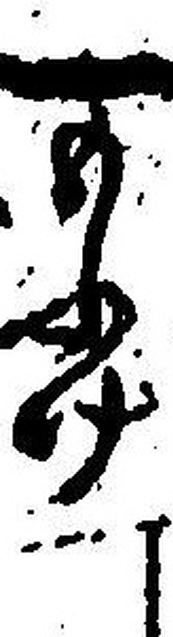もふけ
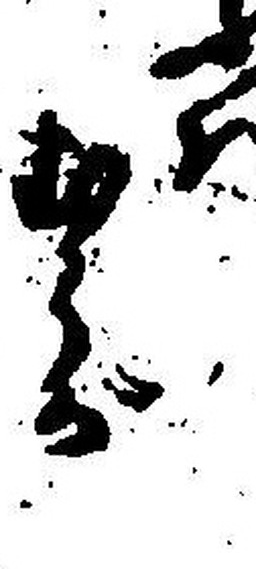むらが
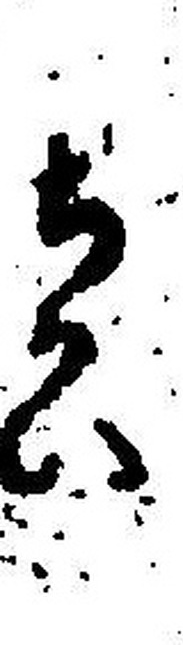ちかい
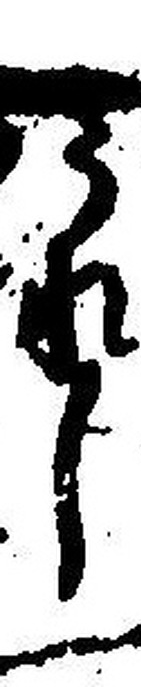うれし
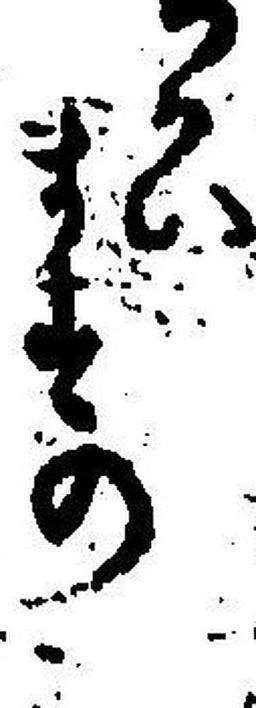ますの
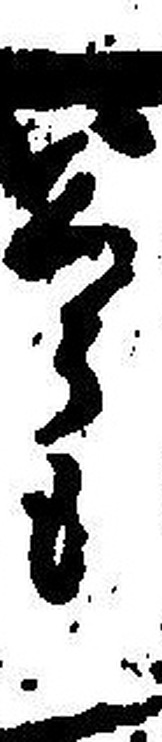いくらも
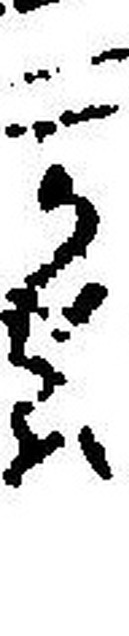かねは
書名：天竺儲之筋 / 市場通笑作
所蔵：東京大学総合図書館 General Library in the University of Tokyo, JAPAN
